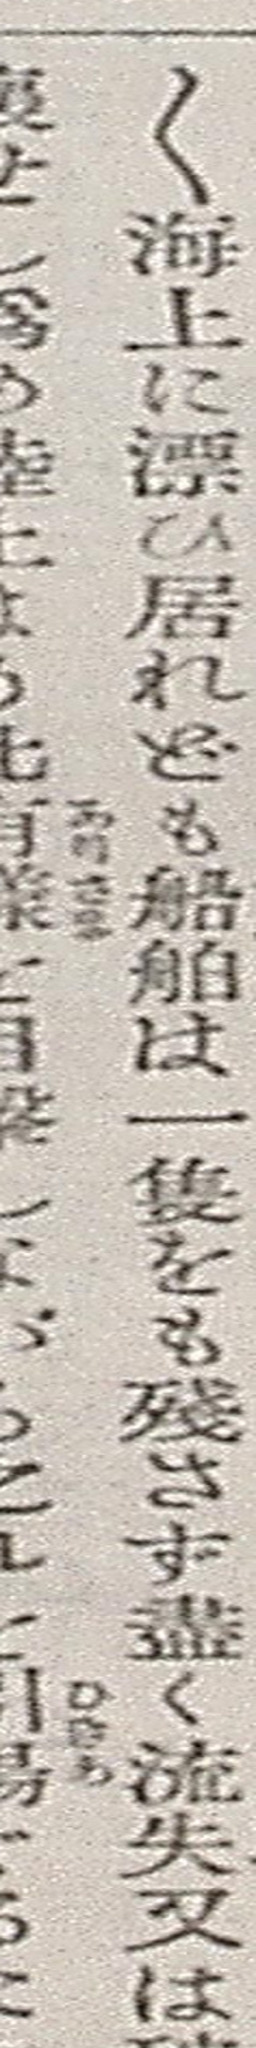壊せし為め陸上より此有様を目撃しながら之れを引揚ぐるに由
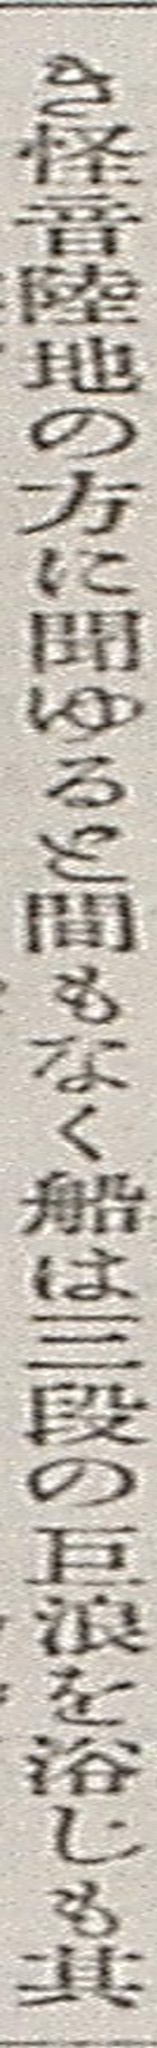き怪音陸地の方に聞ゆると間もなく船は三段の巨浪を浴しも其
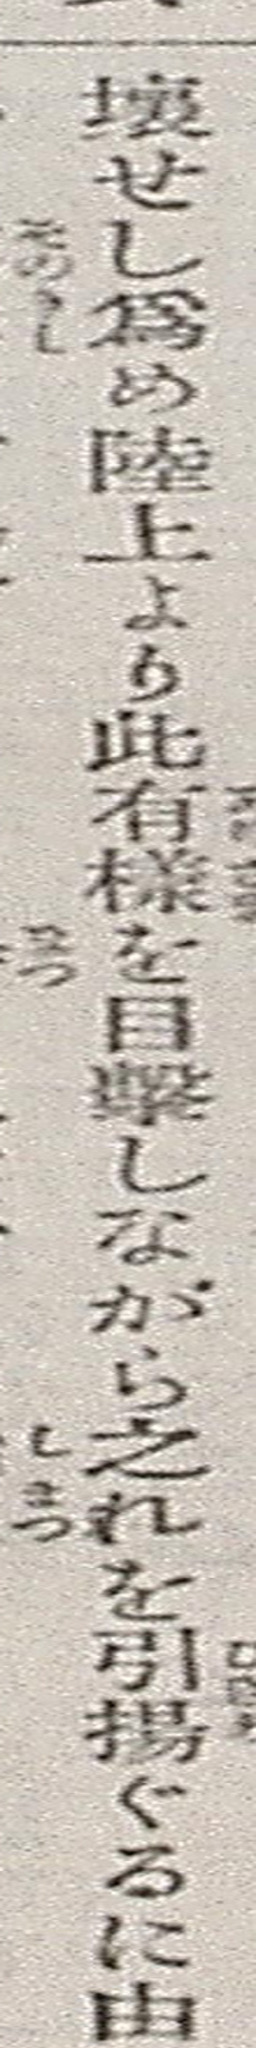壊せし為め陸上より此有様を目撃しながら之れを引揚ぐるに由
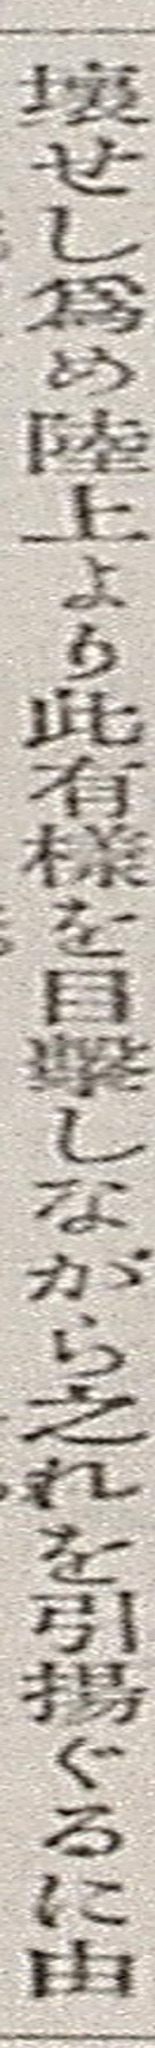壊せし為め陸上より此有様を目撃しながら之れを引揚ぐるに由
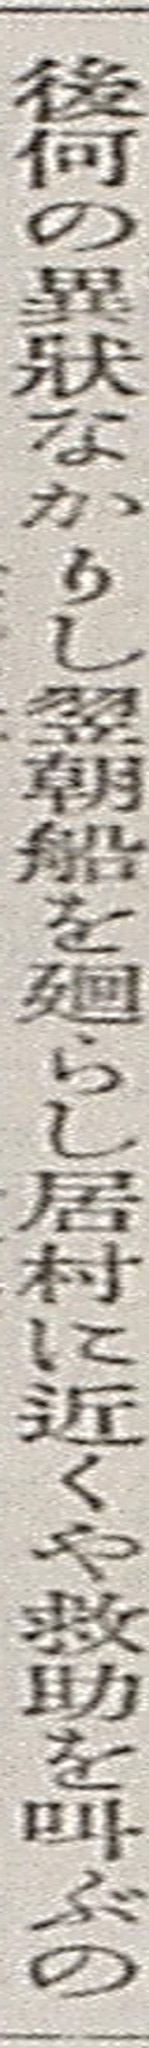後何の異状なかりし翌朝船を廻らし居村に近くや救助を叫ぶの
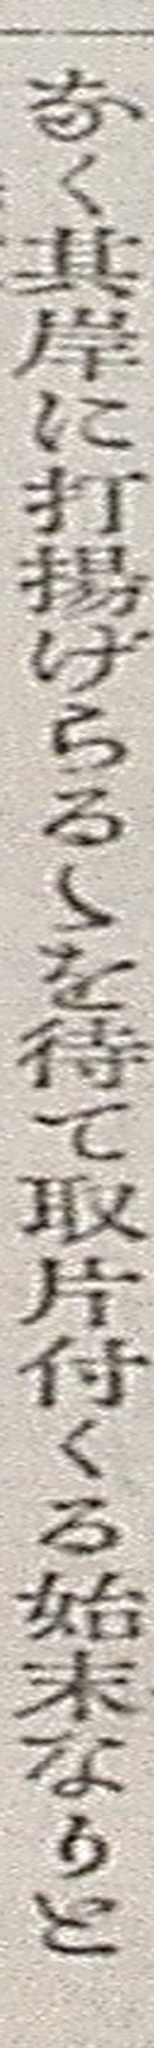なく其岸に打揚げらるゝを待て取片付くる始末なりと
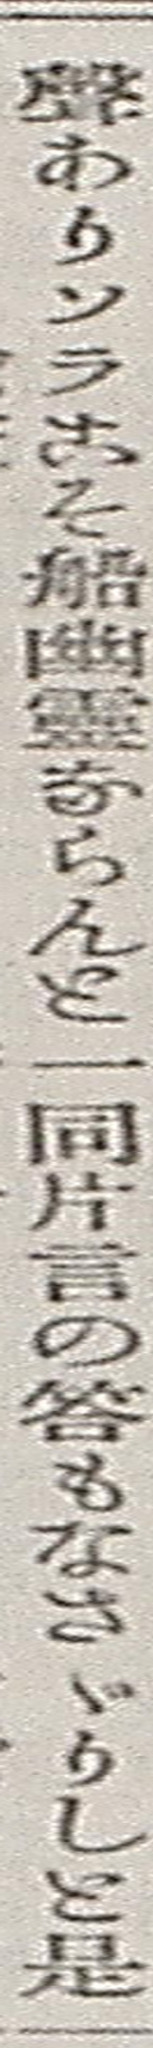声ありソラこそ船幽霊ならんと一同片言の答もなさゞりしと是
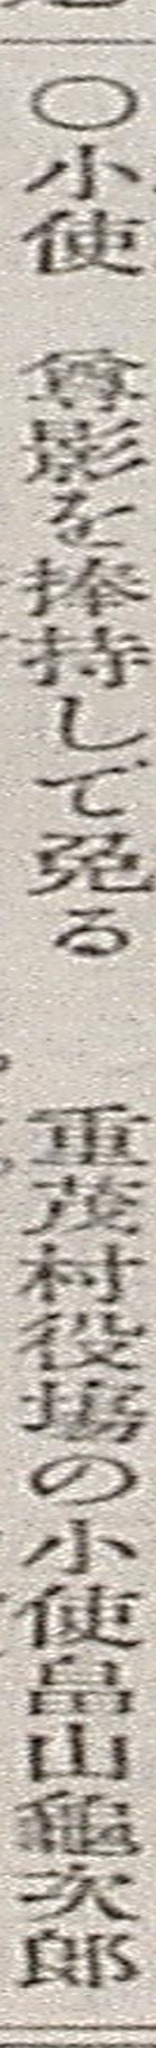○小使尊影を捧持して免る重茂村役場の小使畠山亀次郎
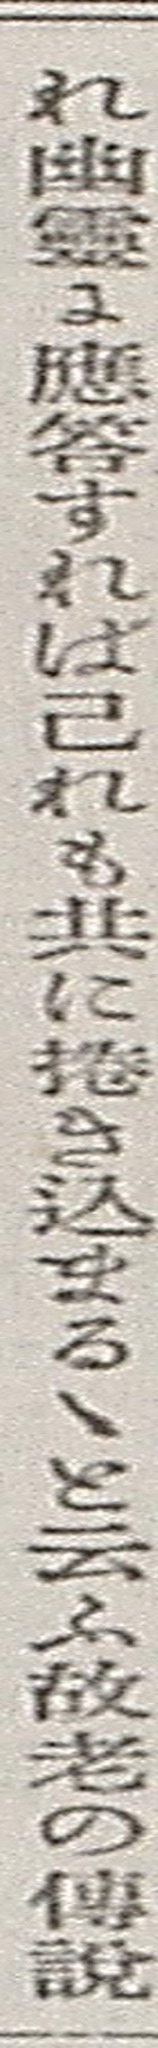れ幽霊に応答すれば己れも共に捲き込まるゝと云ふ故老の伝説
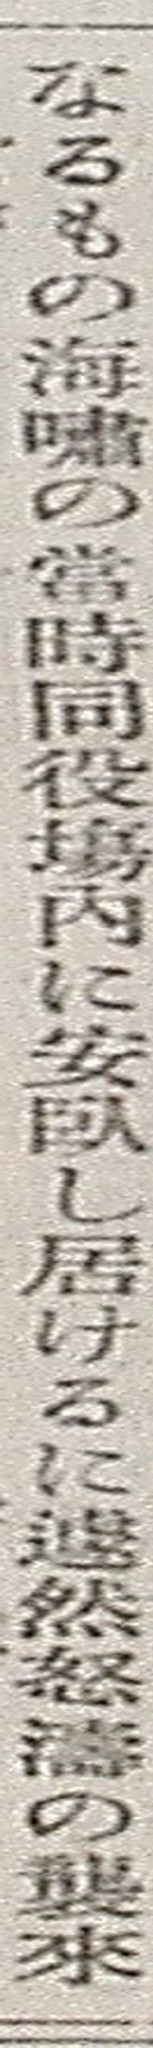なるもの海嘯の当時同役場内に安臥し居けるに遽然怒濤の襲来
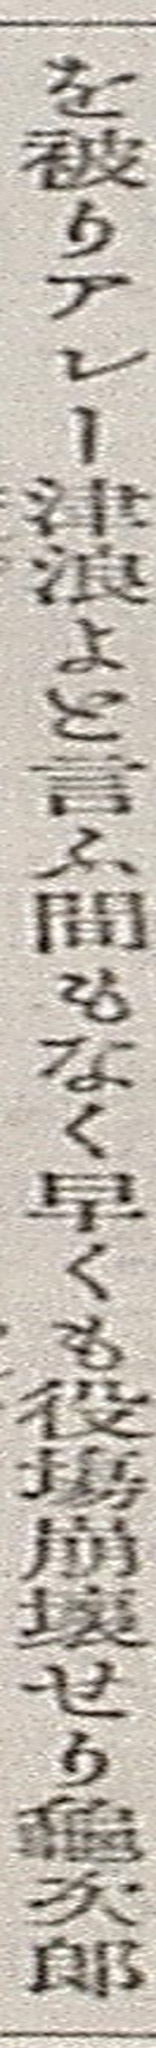を被りアレー津浪よと言ふ間もなく早くも役場崩壊せり亀次郎
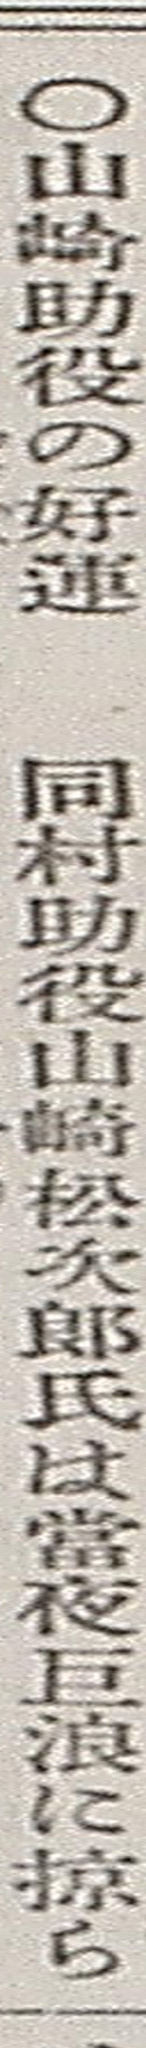○山崎助役の好運同村助役山崎松次郎氏は当夜巨浪に掠ら
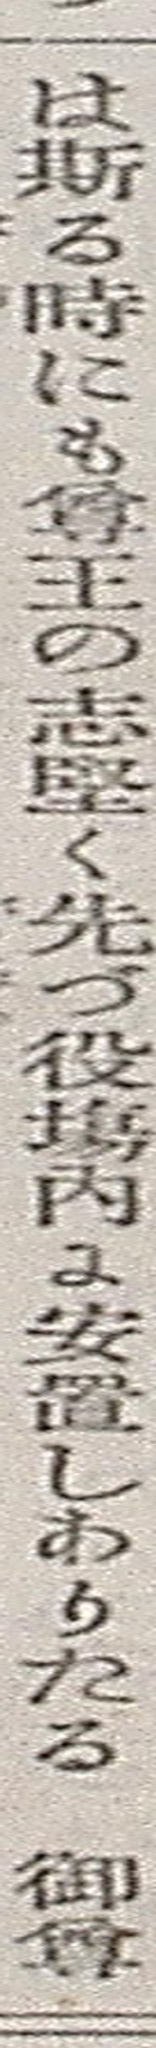は斯る時にも尊王の志堅く先づ役場内に安置しありたる御尊
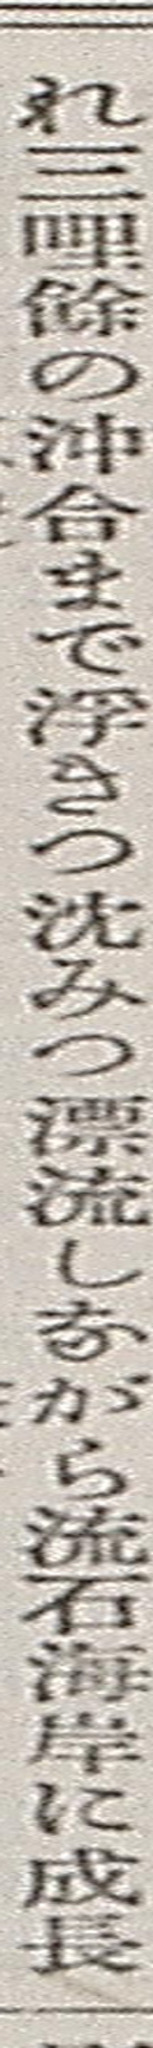れ三哩余の沖合まで浮きつ沈みつ漂流しながら流石海岸に成長
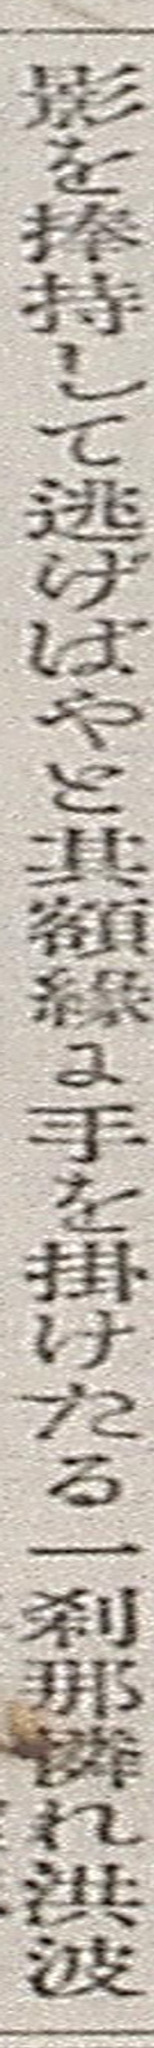影を捧持して逃げばやと其額縁に手を掛けたる一刹那憐れ洪波
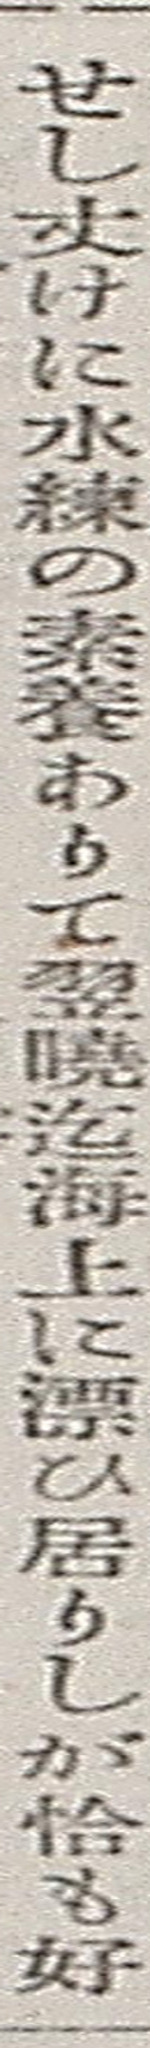せし丈けに水練の素養ありて翌暁迄海上に漂ひ居りしが恰も好
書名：風俗畫報臨時増刊第百十九號　大海嘯被害録（中）
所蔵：東京大学地震研究所図書室 Earthquake Research Institute Library, The University of Tokyo, JAPAN
